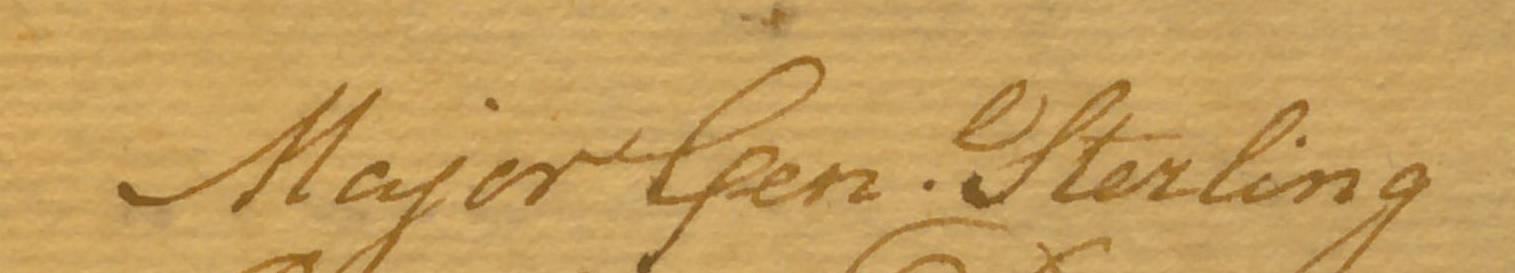Major Gen^l. Sterling
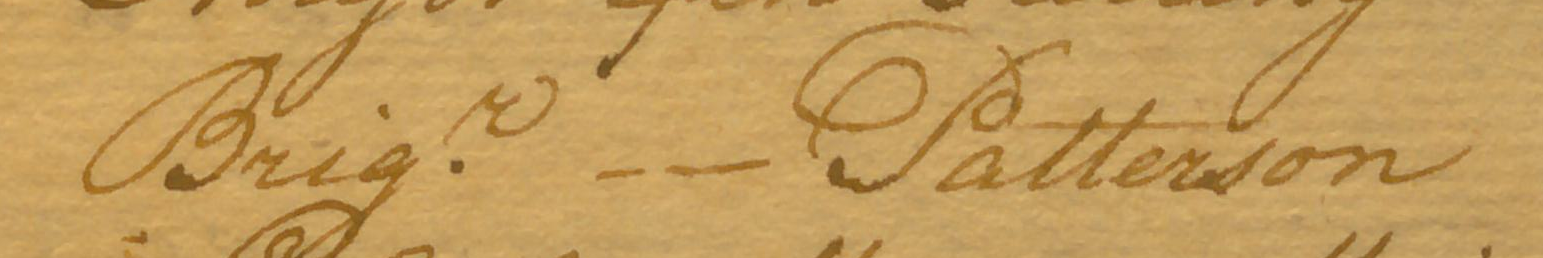Brig^r. -- Patterson
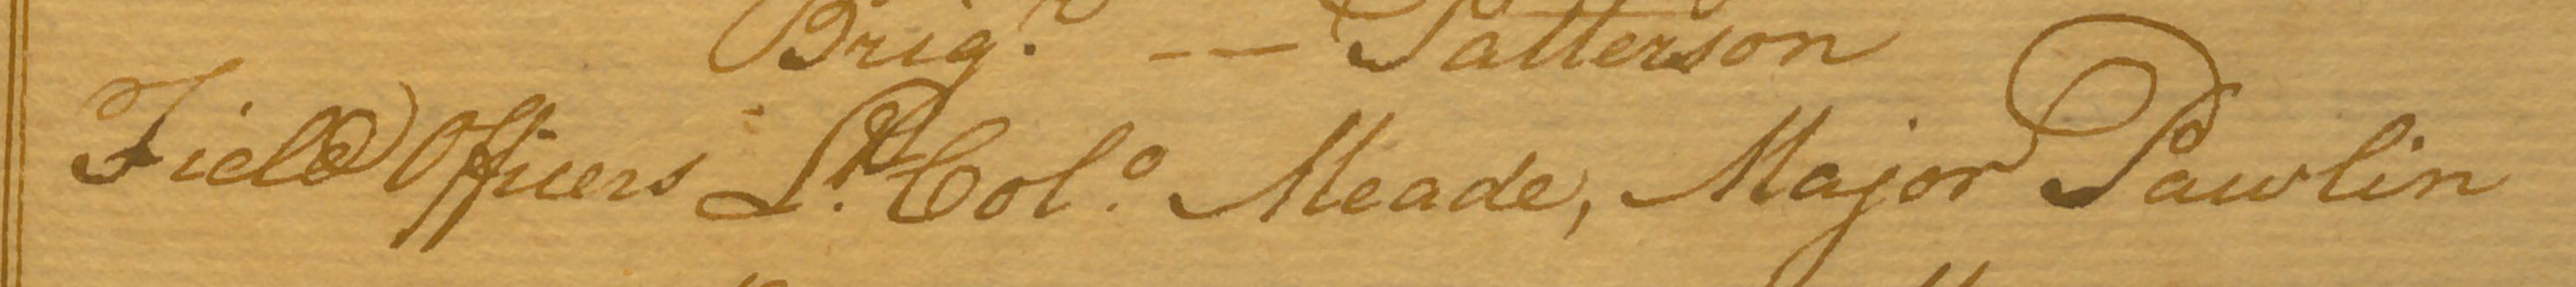Field Officers L^t. Col^o. Meade, Major Pawlin
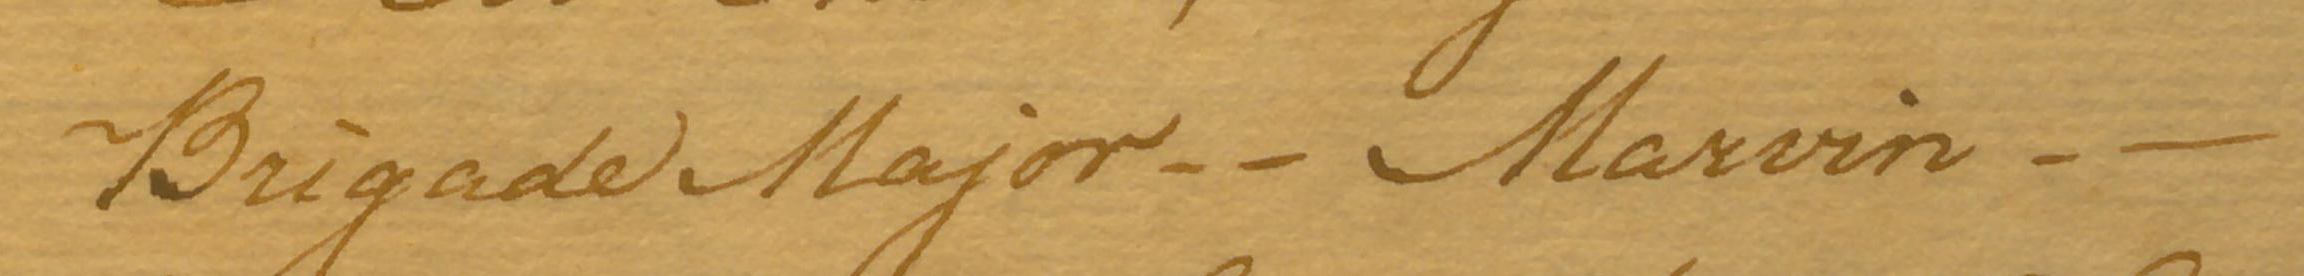Brigade Major-- Marvin--
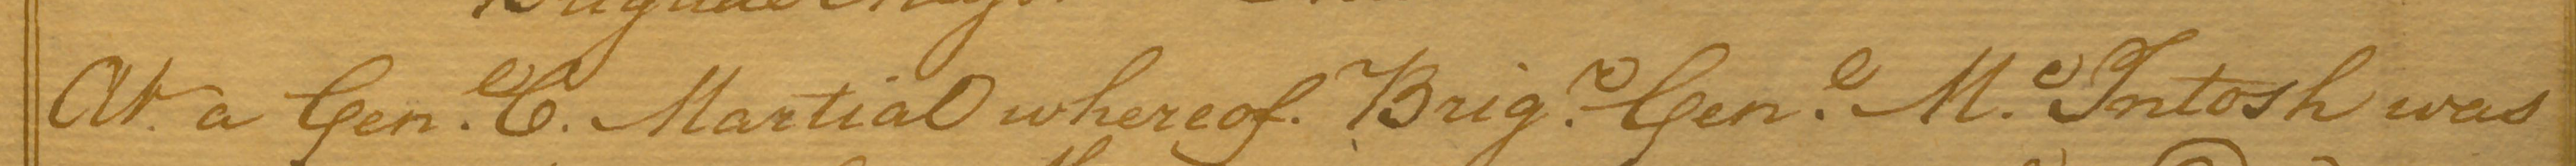At a Gen^l. C. Martial whereof Brig^r. Gen^l. M^c.Intosh was
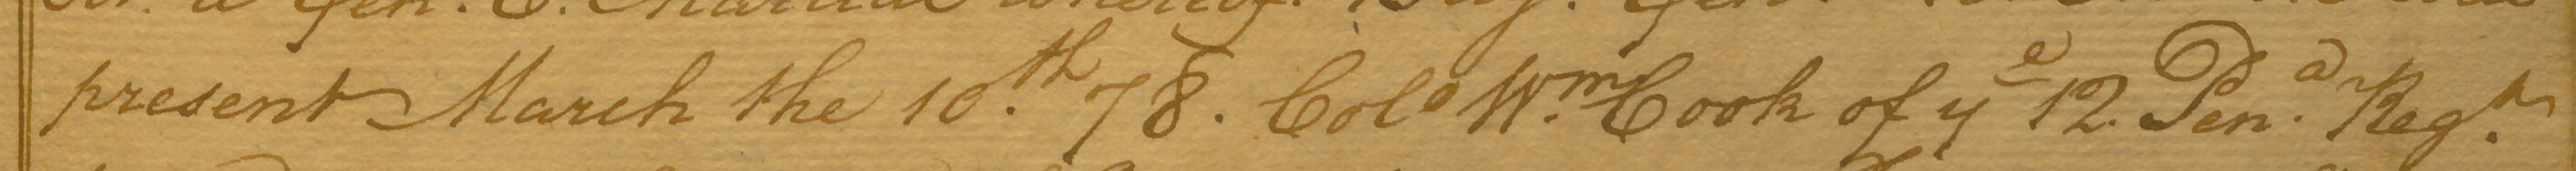present March the 10^th. 78. Col^o. W^m. Cook of y^e 12 Pen^a. Reg^t.
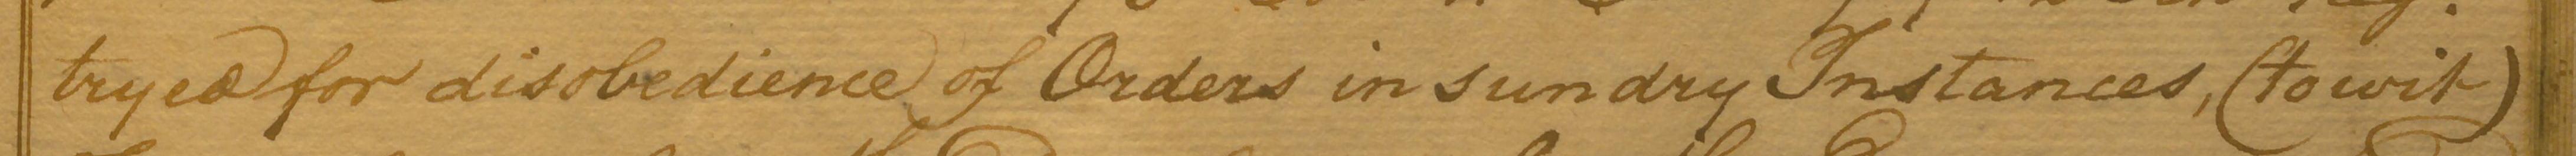tryed for disobedience of Orders in sundry Instances, (to wit)
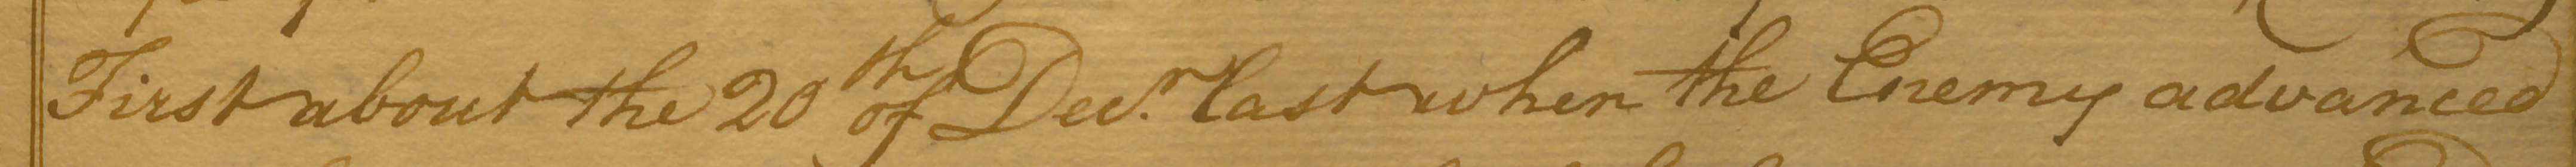First about the 20^th of Dec^r. last when the Enemy advanced
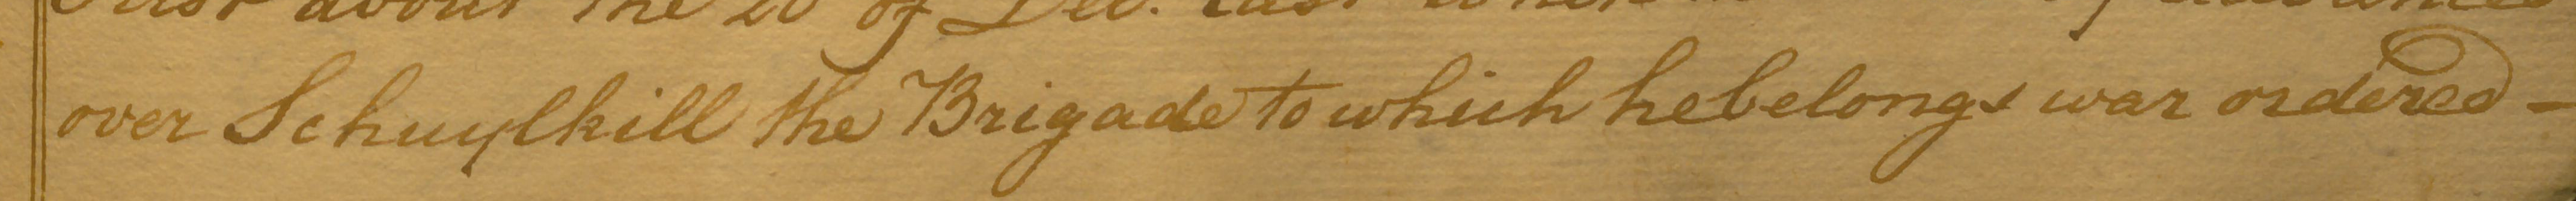over Schuylkill the Brigade to which he belongs war ordered-
